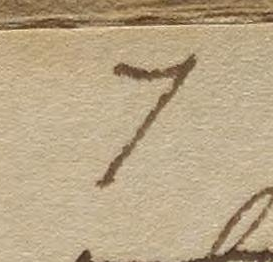7
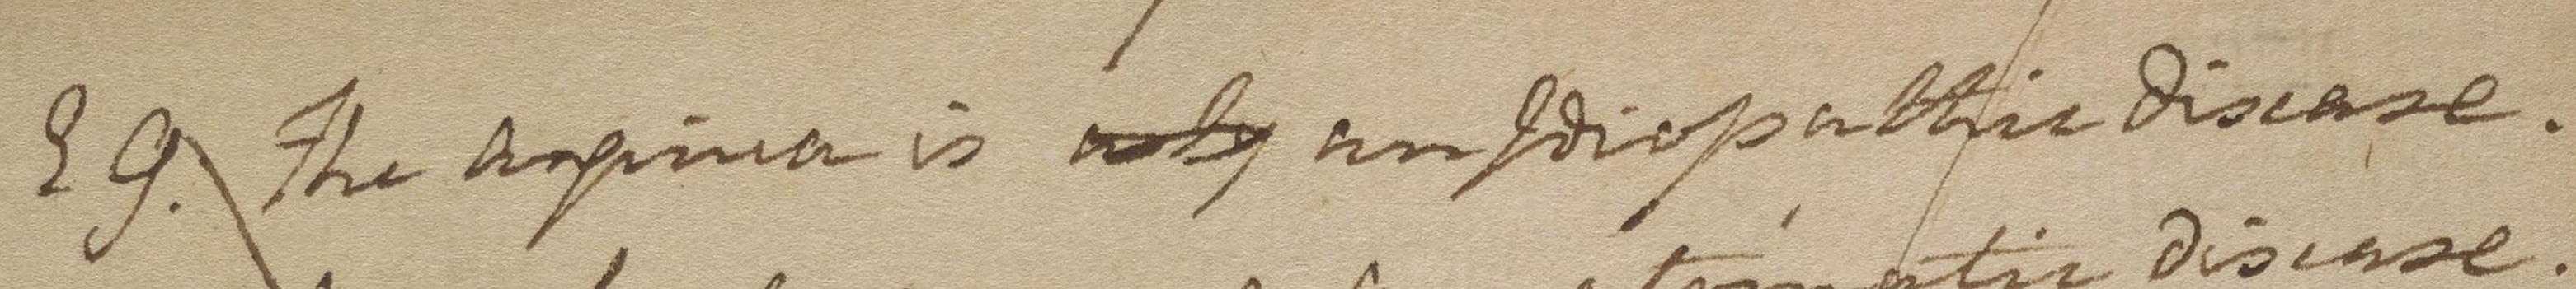E.g. the angina is [only] an idiopathic disease.
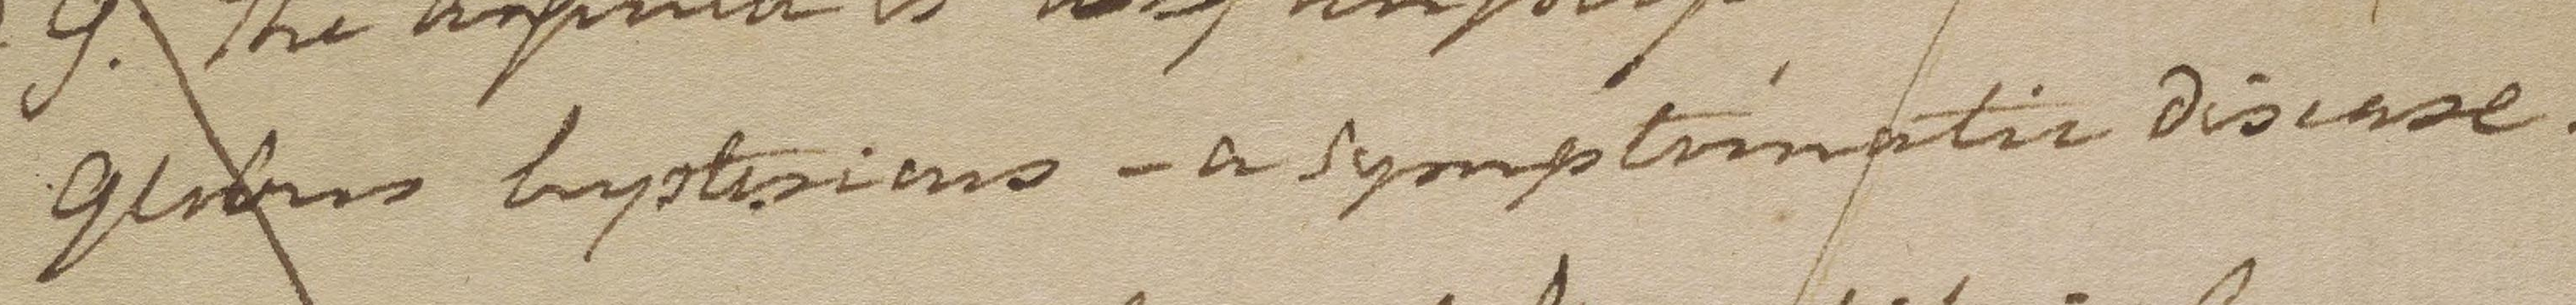globus hysterians- a symptomatic disease.
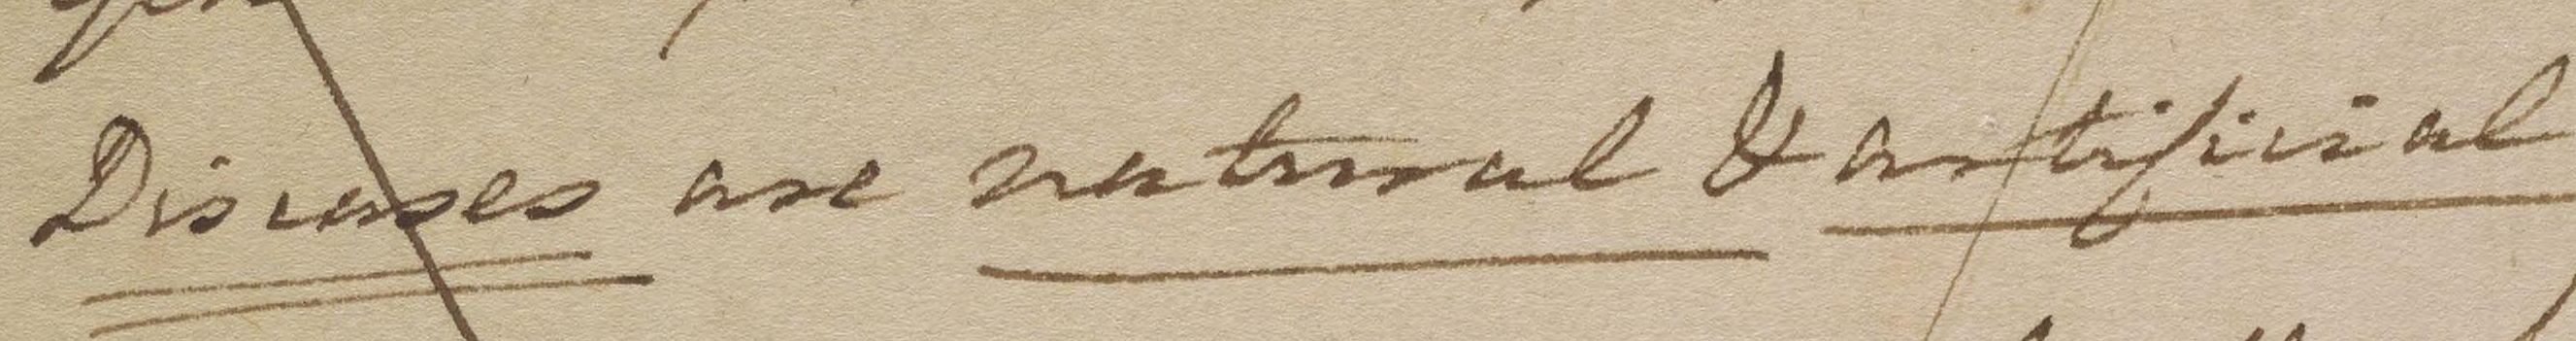Disease are natural & artificial
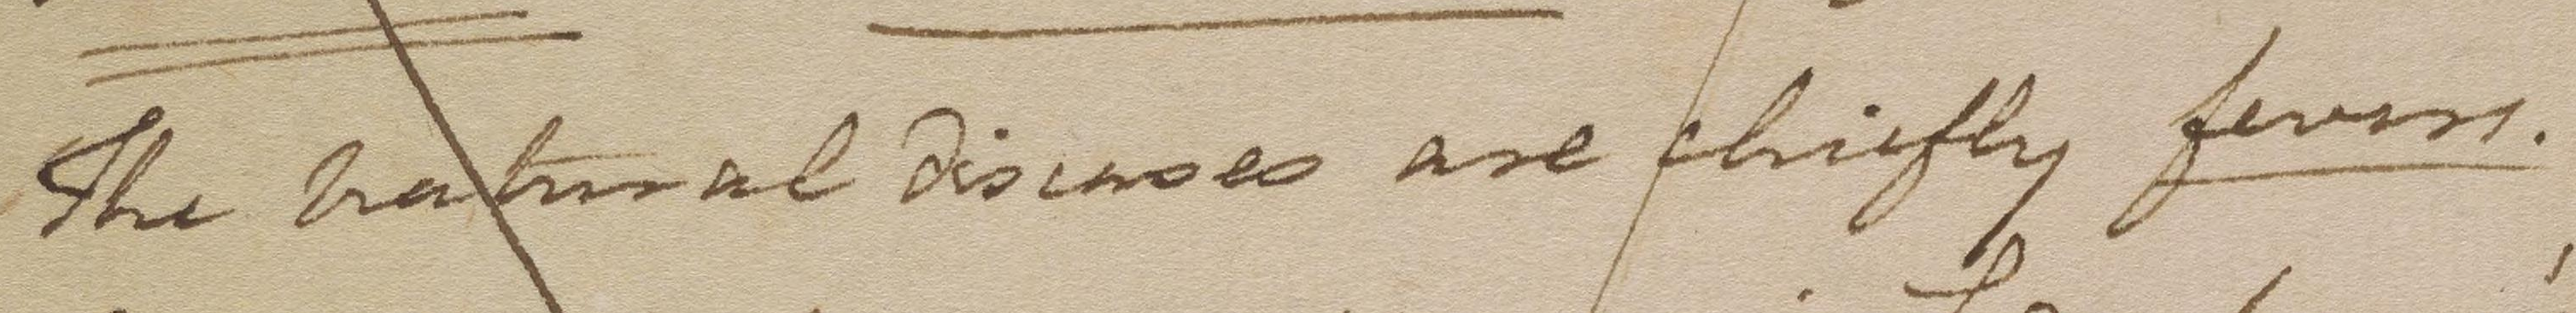The natural diseases are chiefly fevers
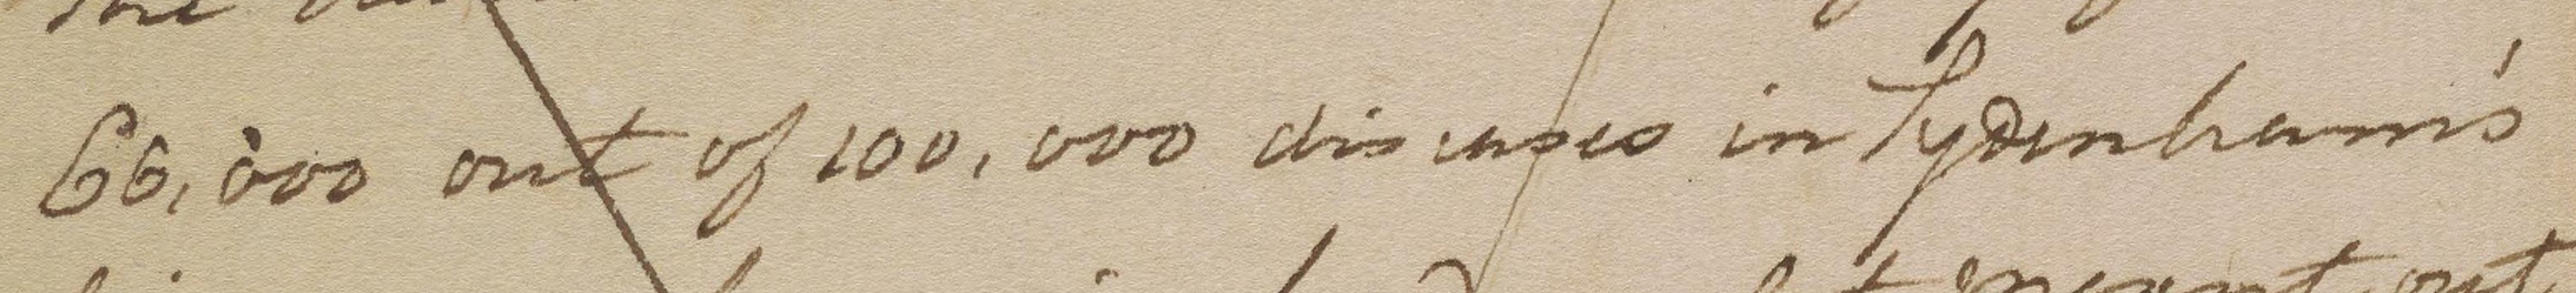66,000 out of 100,000 diseases in Sydenham's
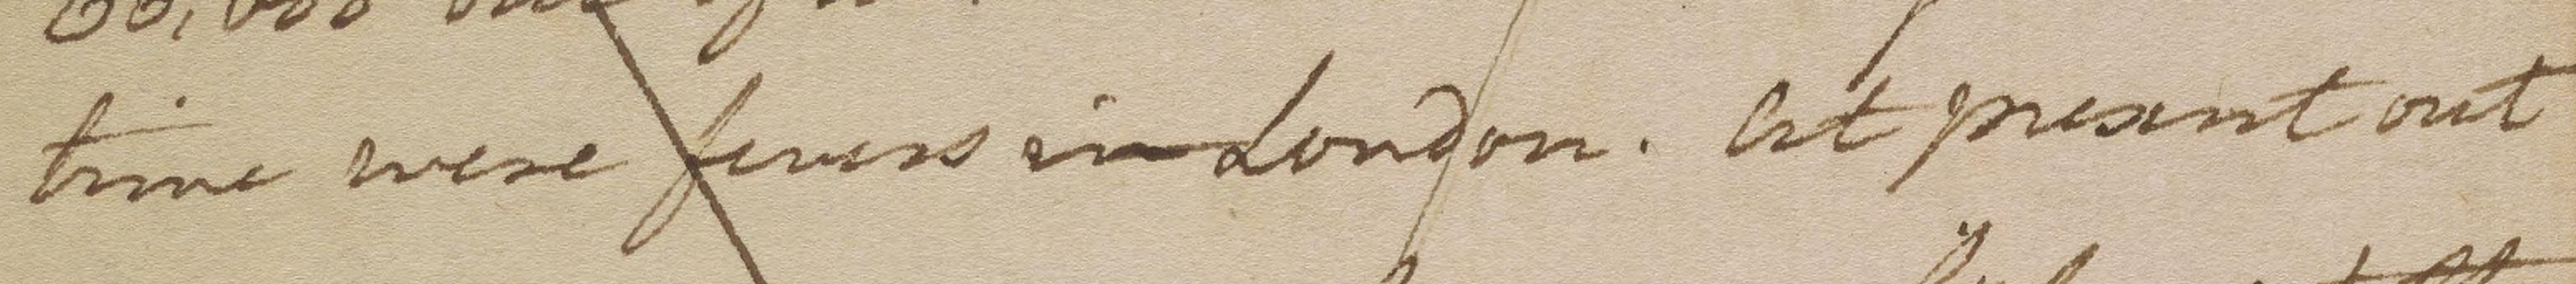time were fevers in London. At present out
